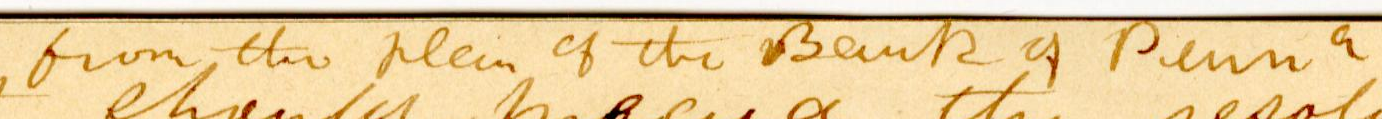From the plein of the Bank of Penn^a
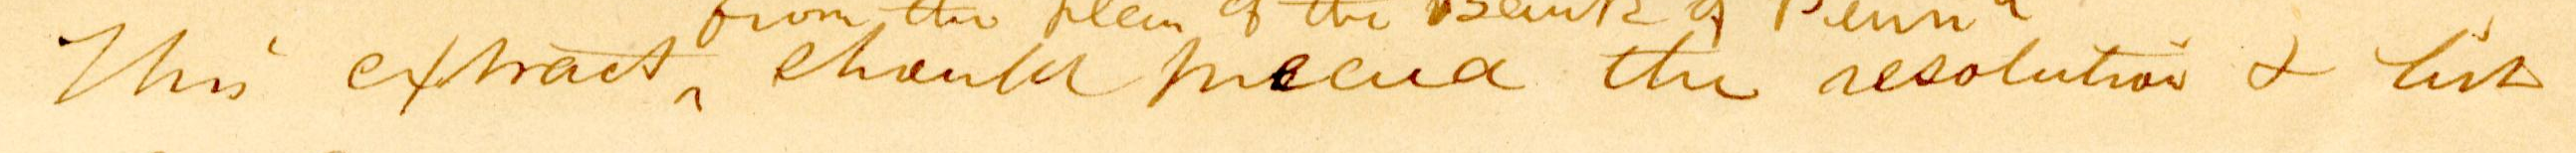Ths' extract ^ should prelud the resolutions & list
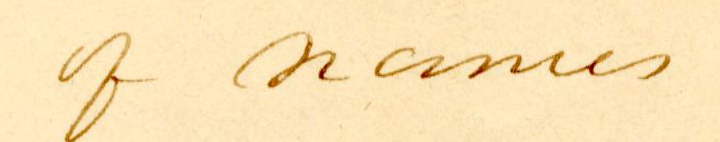of Names
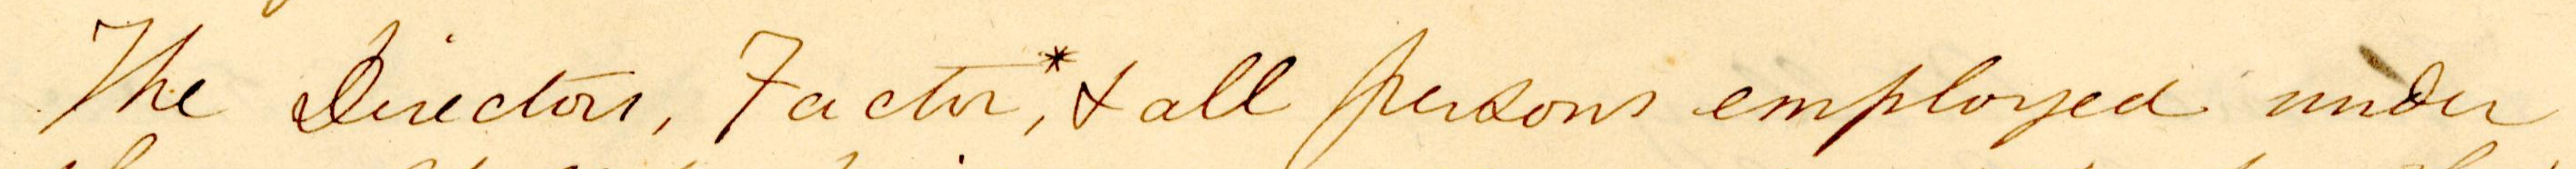The Directors, Factor,* & all persons employed under
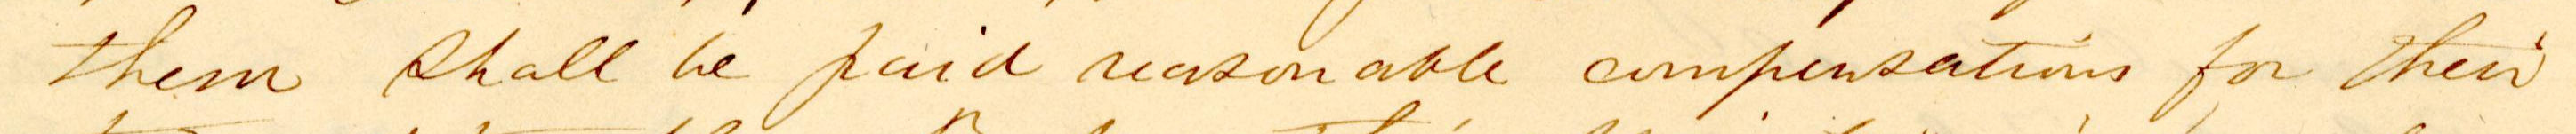them shall be paid reasonable compensations for their
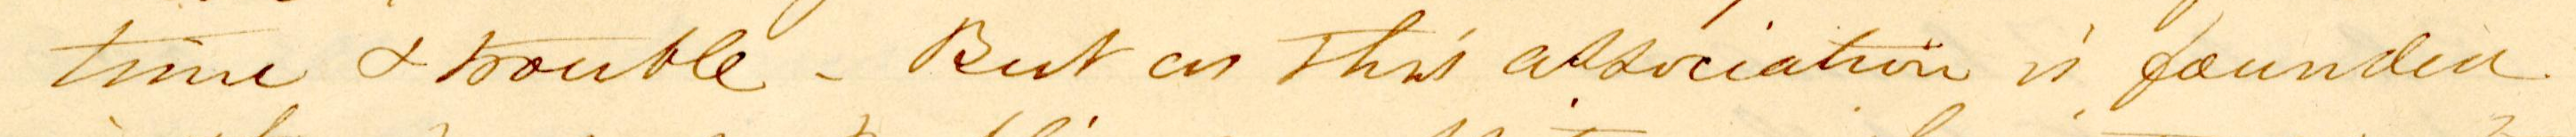time & trouble. But as this appreciation is founded
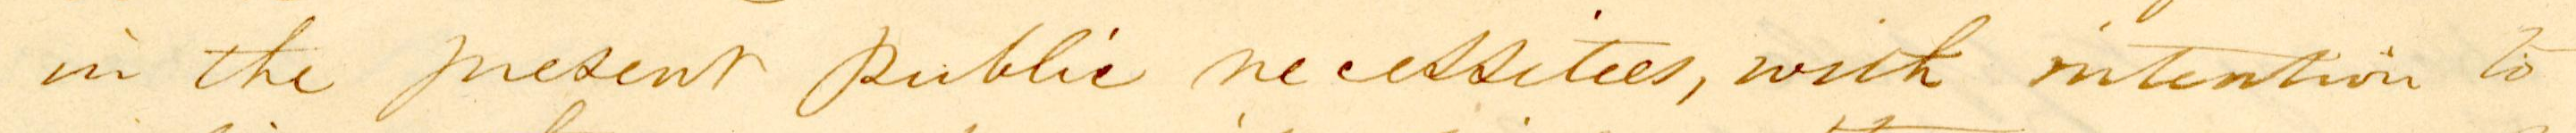in the present public necessities, with intention to
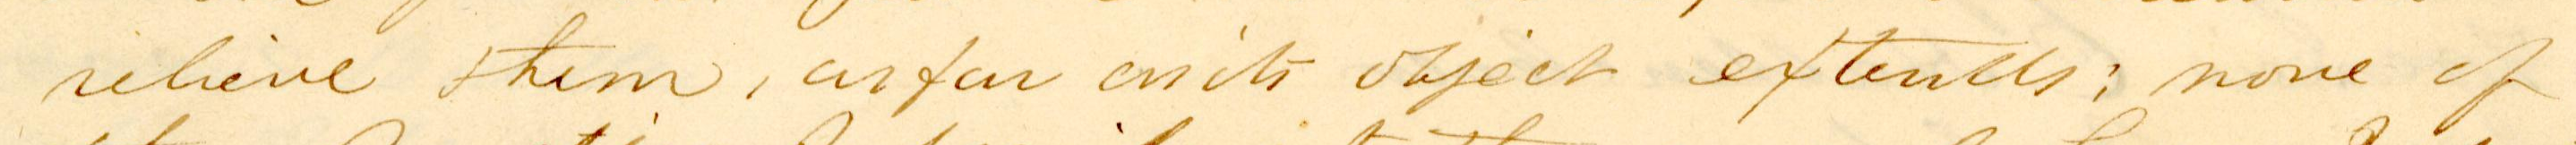relieve thim, as far omits object externals; none of
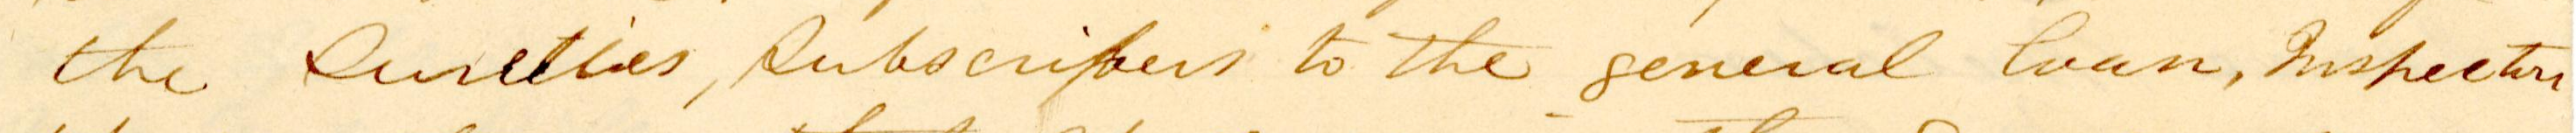the Sureties, subscribers to the general loan, Inspection
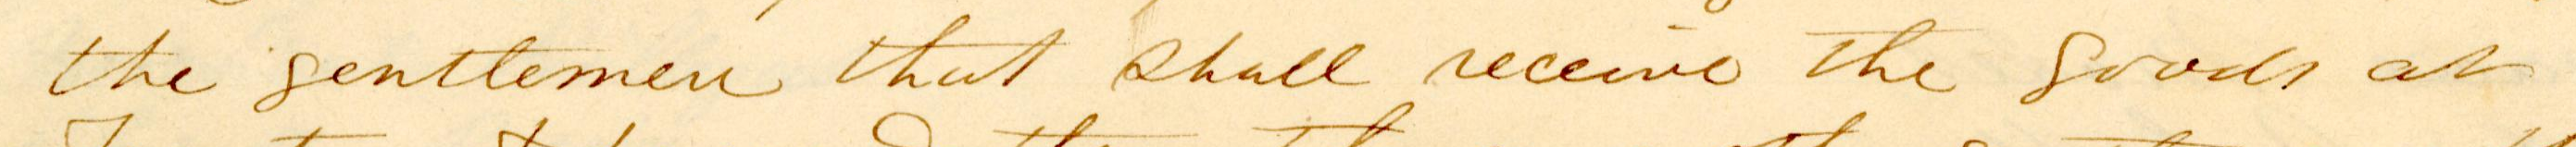the gentlemen that shall receive the goods at
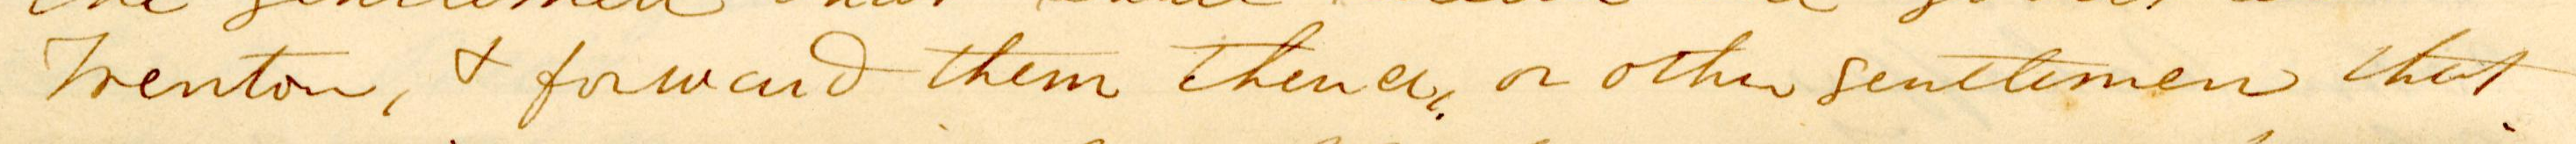Trenton, & forward them themce, or other gentlemen that
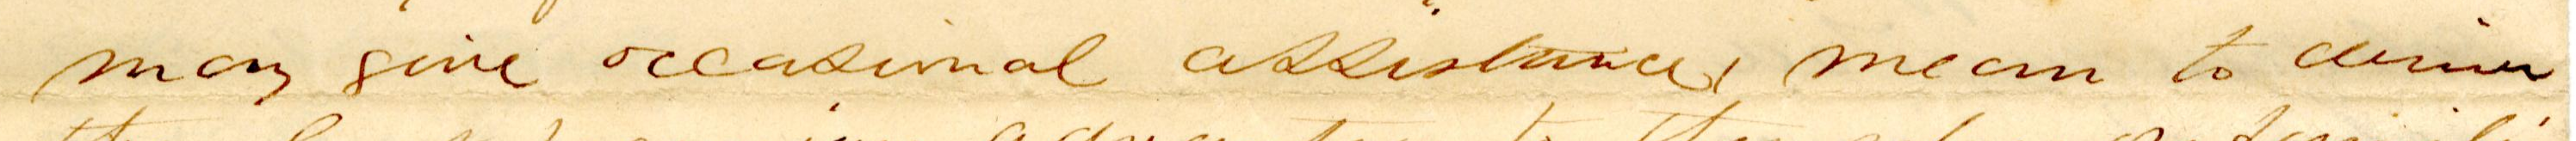may give occasional assistance mean to claim
